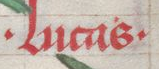Lucas
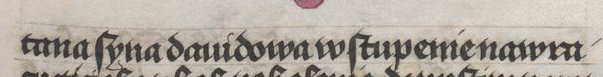tana ſyna dauidowa wſtupené nawra¬
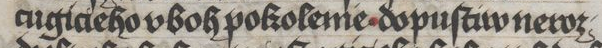cugícieho v boh pokolenie.dopuſtiw neroz¬
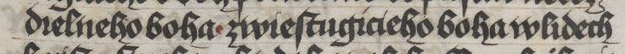dielneho boha.zwieſtugicíeho boha wlidech
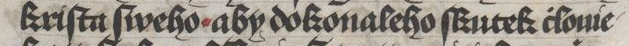kriſta ſweho.aby dokonaleho ſkutek ċlouie-
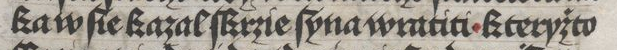ka w ſie kazal ſkrzie ſyna wratiti.kteryžto
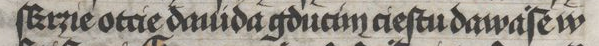ſkrzie otcie dauida gducim cieſtu dawaẛe w
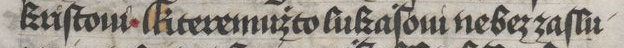kriſtoui.Kteremužto lukaẛoui nebez zaſlu¬
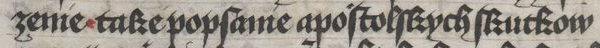zenie.také popſtanie apoẛtolſkych ſkutkow
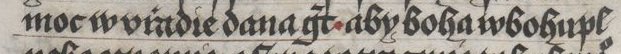moc w vṙadie dana ḡt.aby boha wbohupl¬
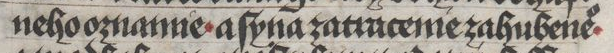neho oznamie.a ſyna zatracenie zahubeneo.
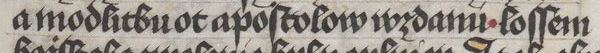a modlitbu ot apoẛtolow wzdanu.loſſem
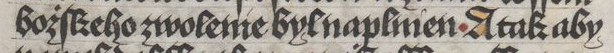bożſkeho zwoleníe byl naplnien.A tak aby
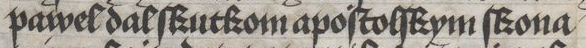pawel dal ſkutkom apoẛtolſkym ſkona¬
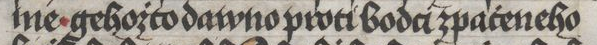nie.gehożto dawno proti bodci zpaċeneho
